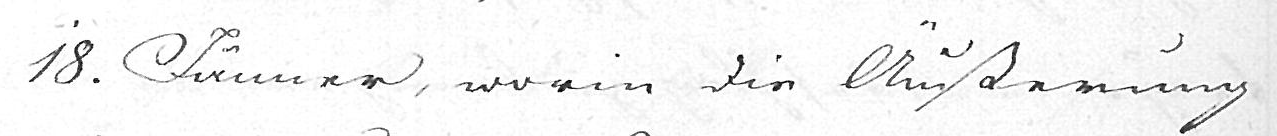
18. Jänner, worin die Äußerung
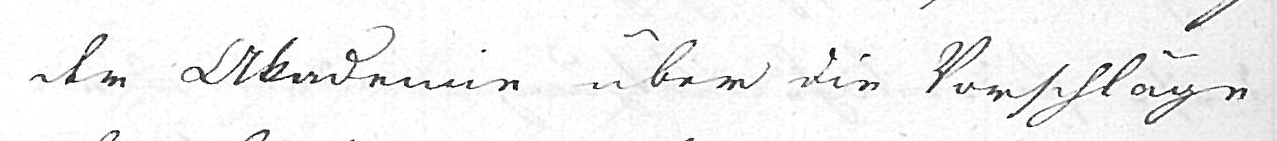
der Akademie über die Vorschläge
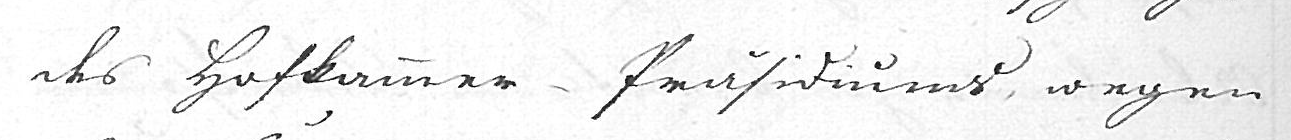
des Hofkammer-Präsidiums wegen
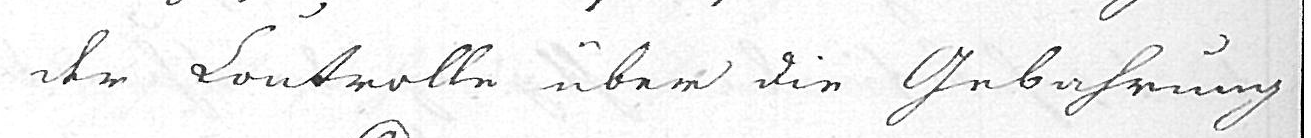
der Controlle über die Gebahrung
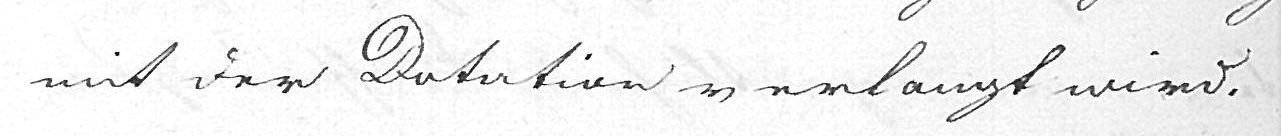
mit der Dotation verlangt wird.
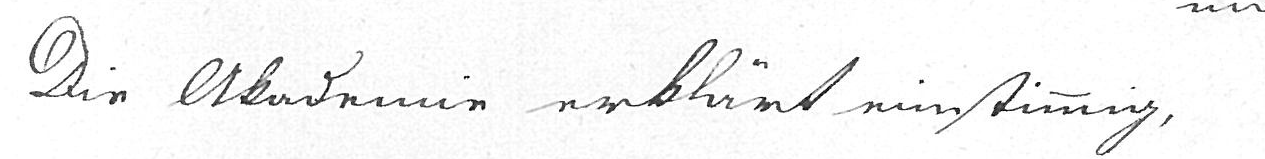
Die Akademie erklärt einstimmig,
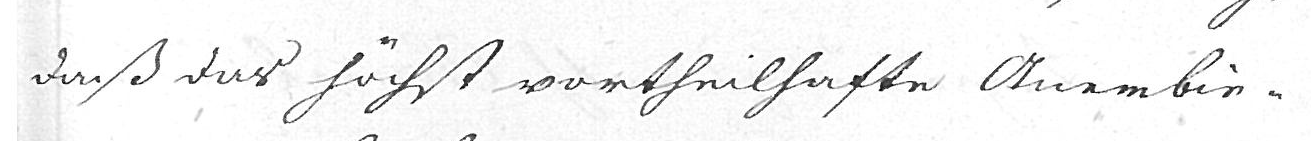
daß das höchst vortheilhafte Anerbie-
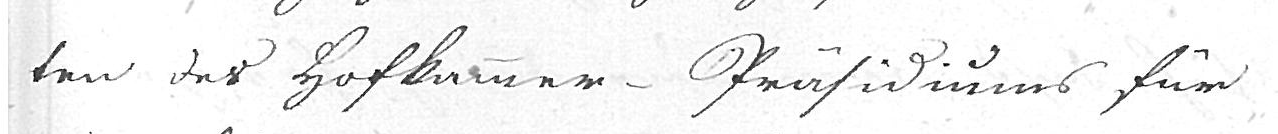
ten des HOfkammer-Präsidiums für
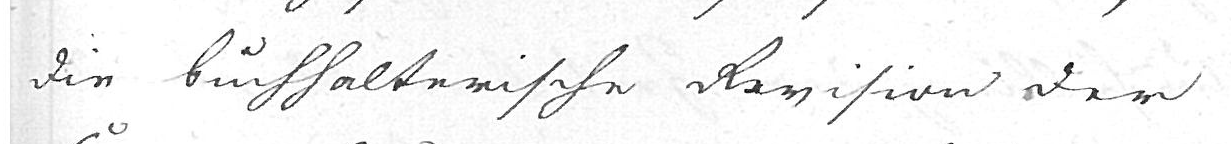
die buhchalterische Revision der
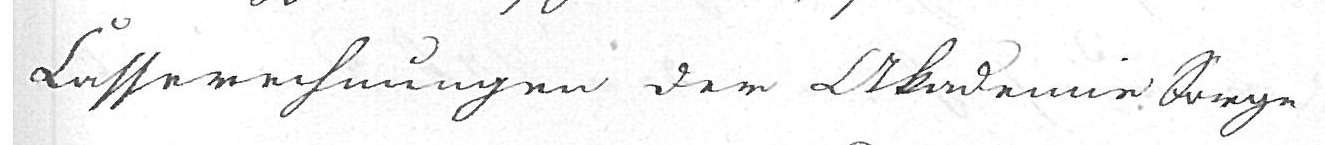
Casserechnungen der Akademie Sorge
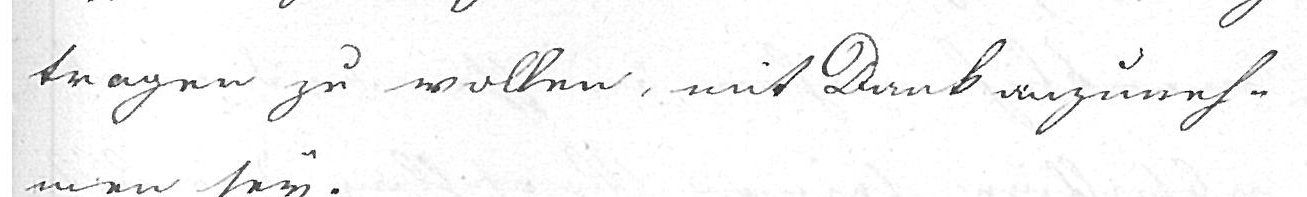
tragen zu wollen, mit Dank anzuneh-
